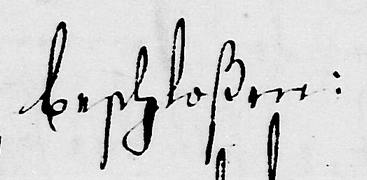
beschloßen:
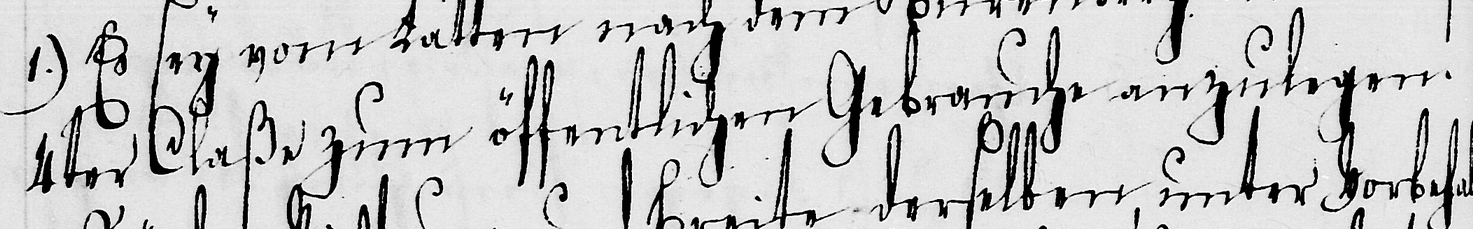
4ter Claße zum öffentlichen Gebrauche anzulegen.
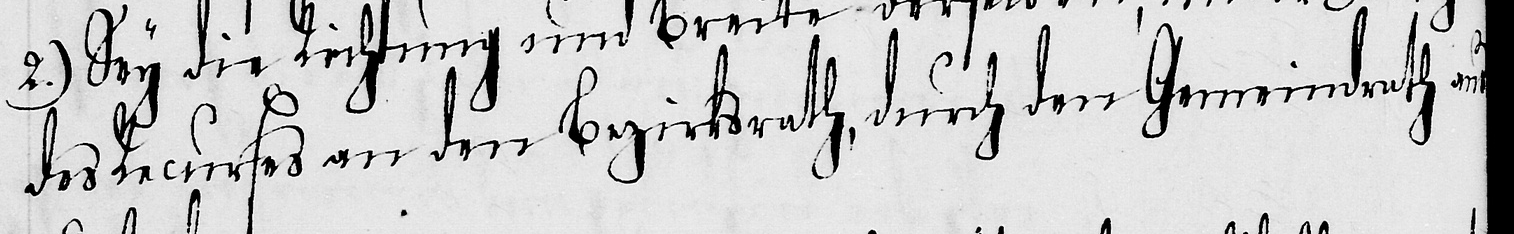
des Recurses an den Bezirksrath, durch den Gemeindrath au¬
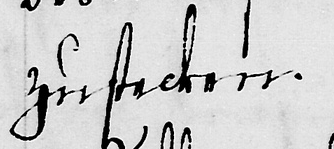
szustecken
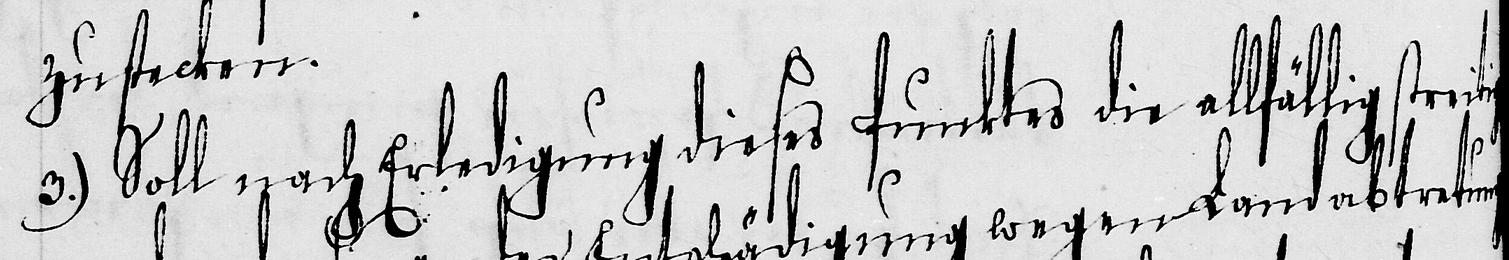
Soll nach Erledigung dieses Punktes die allfällig
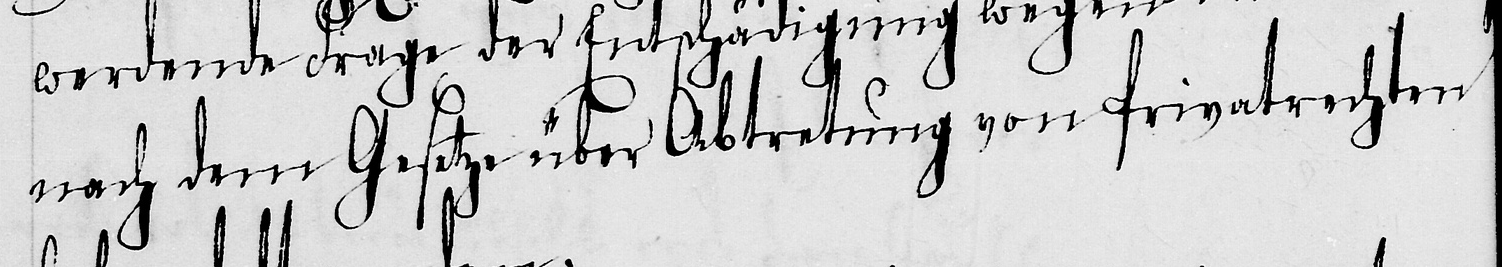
nach dem Gesetze über Abtretung von Privatrechten
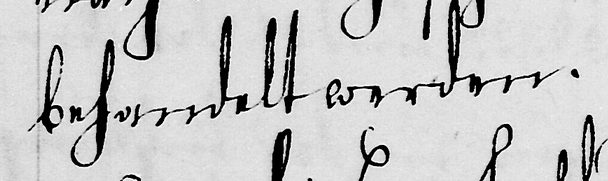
behandelt werden.
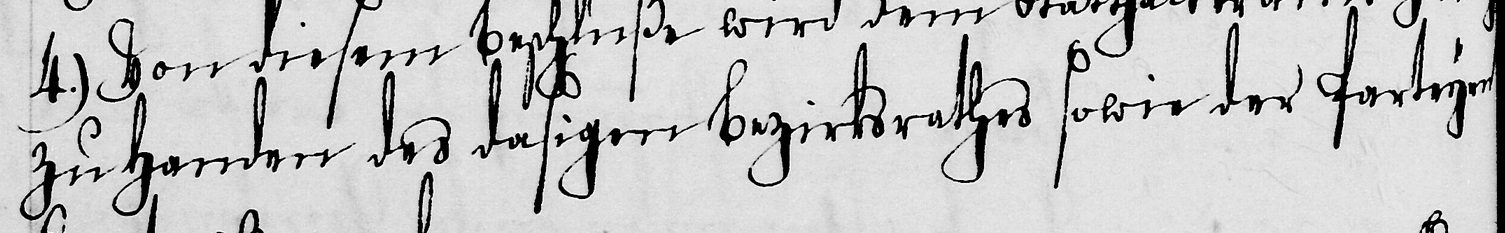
zu Handen des dasigen Bezirksrathes sowie der Parteyen
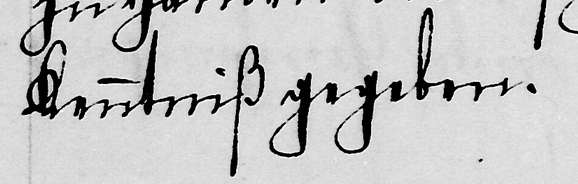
Kenntniß gegeben.
